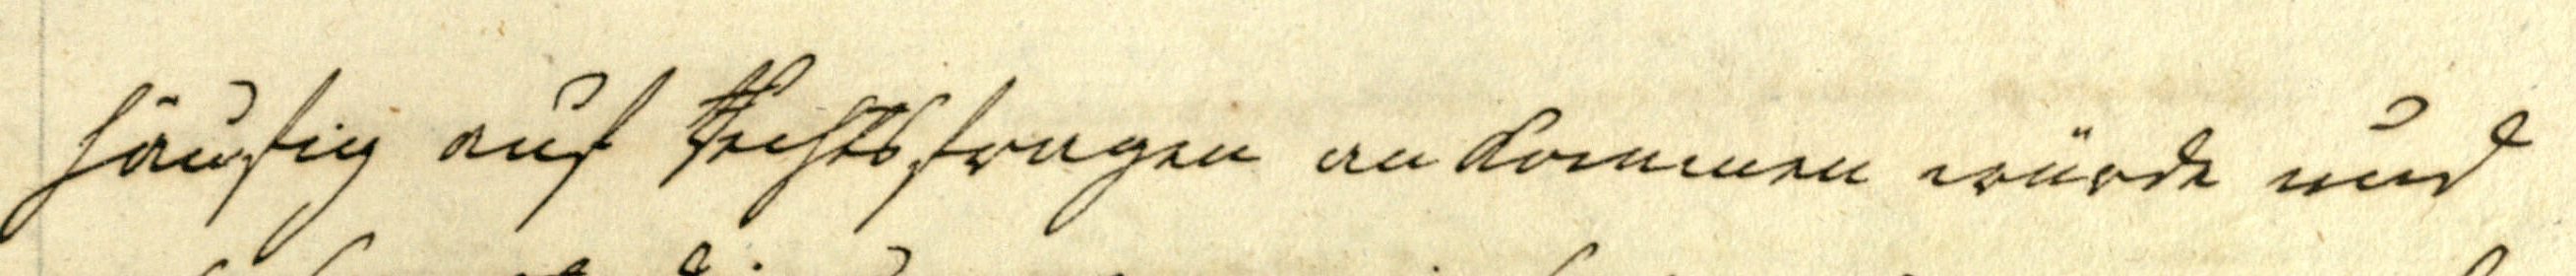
häufig auf Rechts fragen an kommen würde und
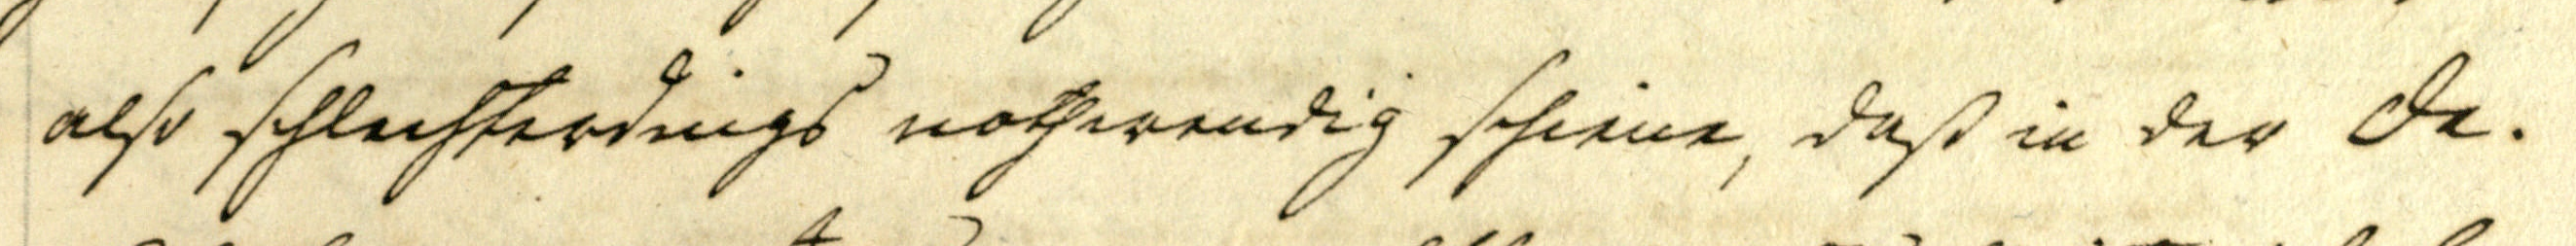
also schlechterdings nothwendig schiene, daß in der De¬
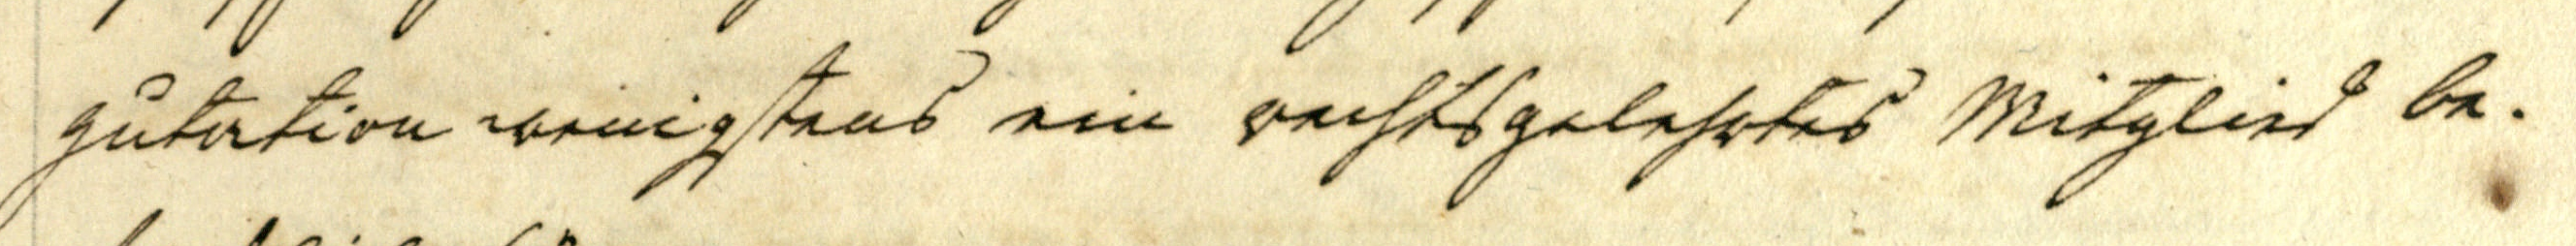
putation wenigstens ein rechtsgelehrtes Mitglied be¬
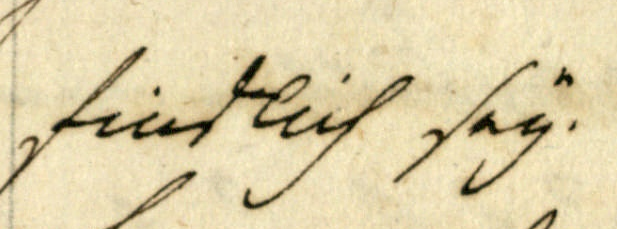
findlich seÿ.
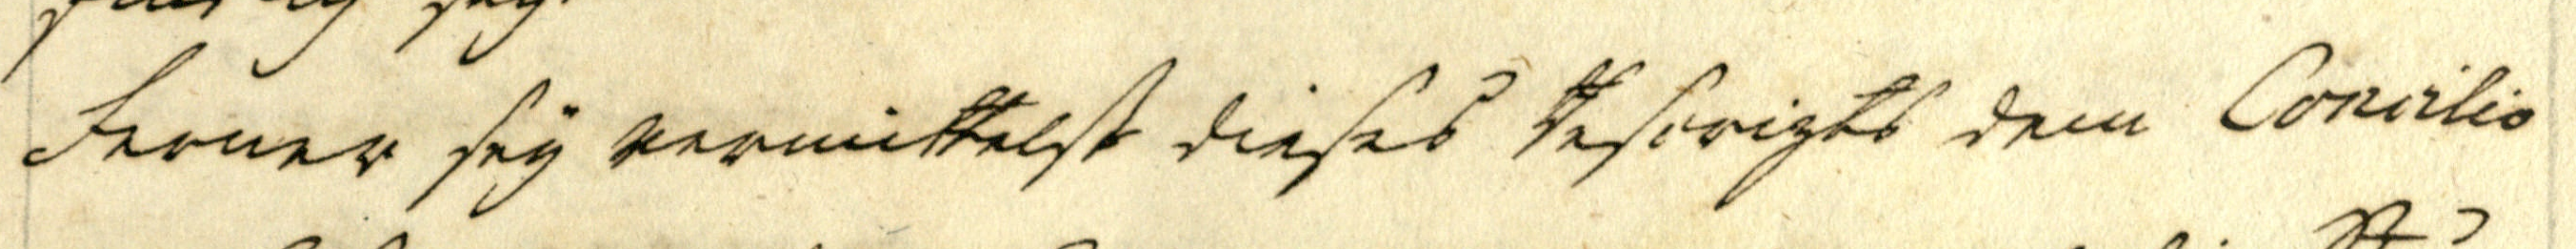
Ferner seÿ vermittelst dieses Rescripts dem Concilio
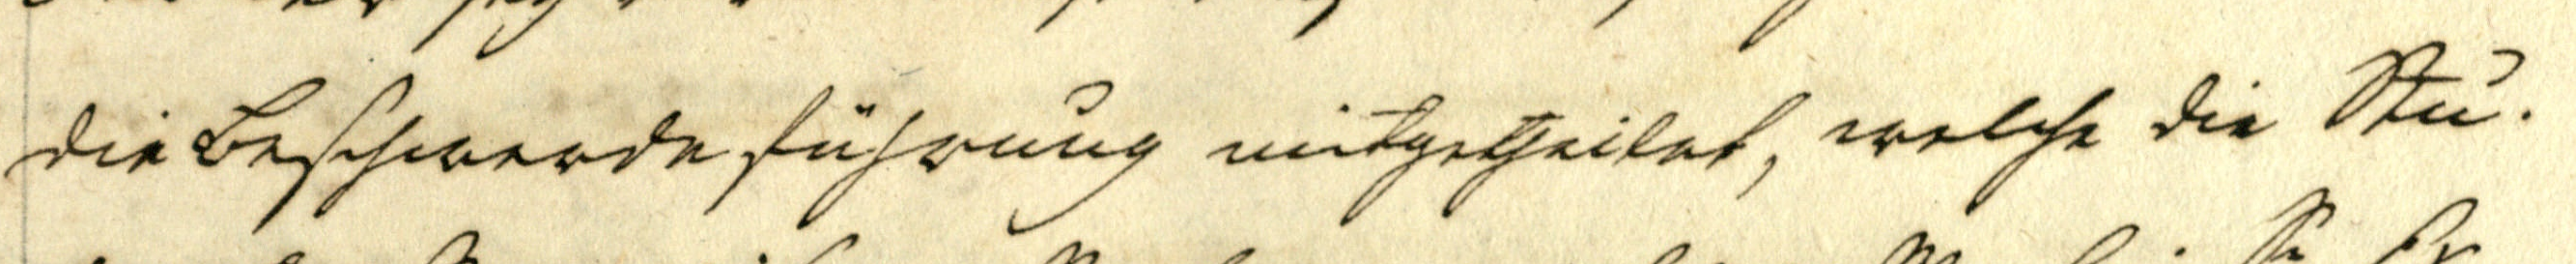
die Beschwerdeführung mitgetheilet, welche die Stu¬
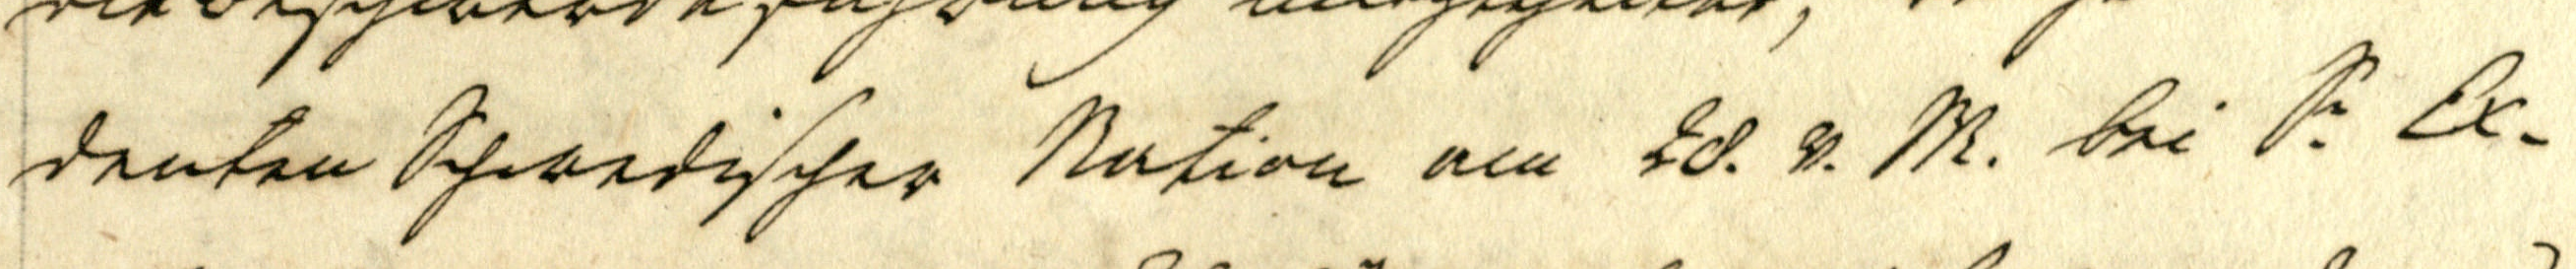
denten Schwedischer Nation am 28. v. M. bei Sr. Ex¬
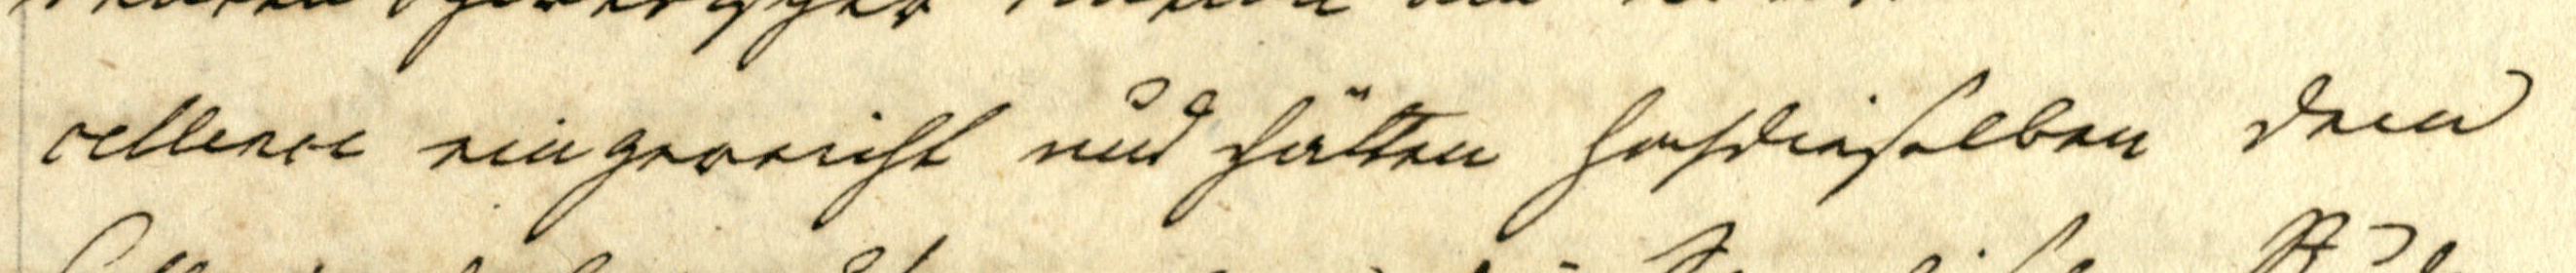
cellence eingereicht und hätten hochdieselben dem
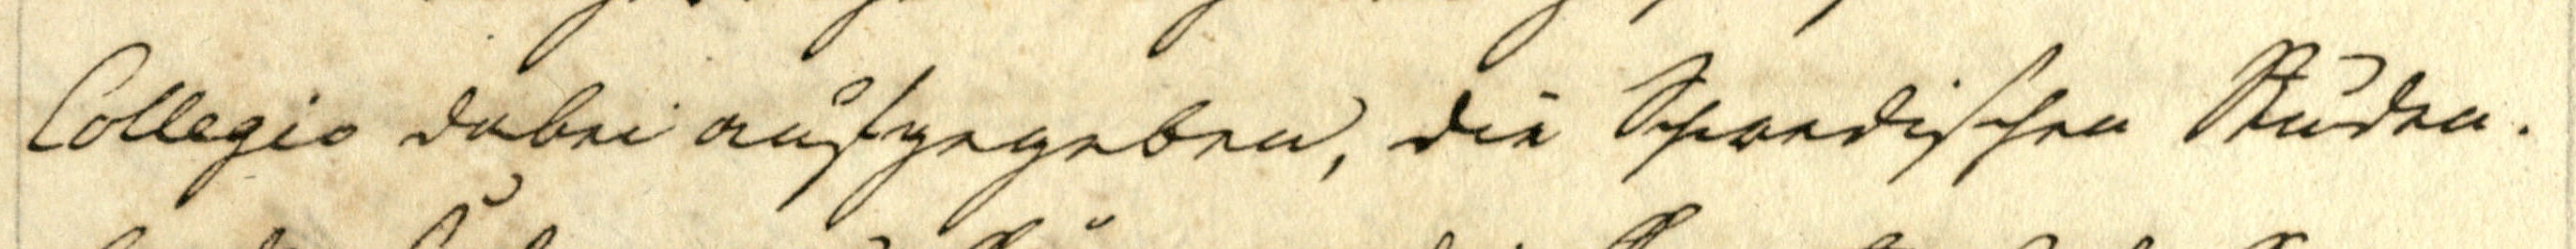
Collegio dabei aufgegeben, die Schwedischen Stunden¬
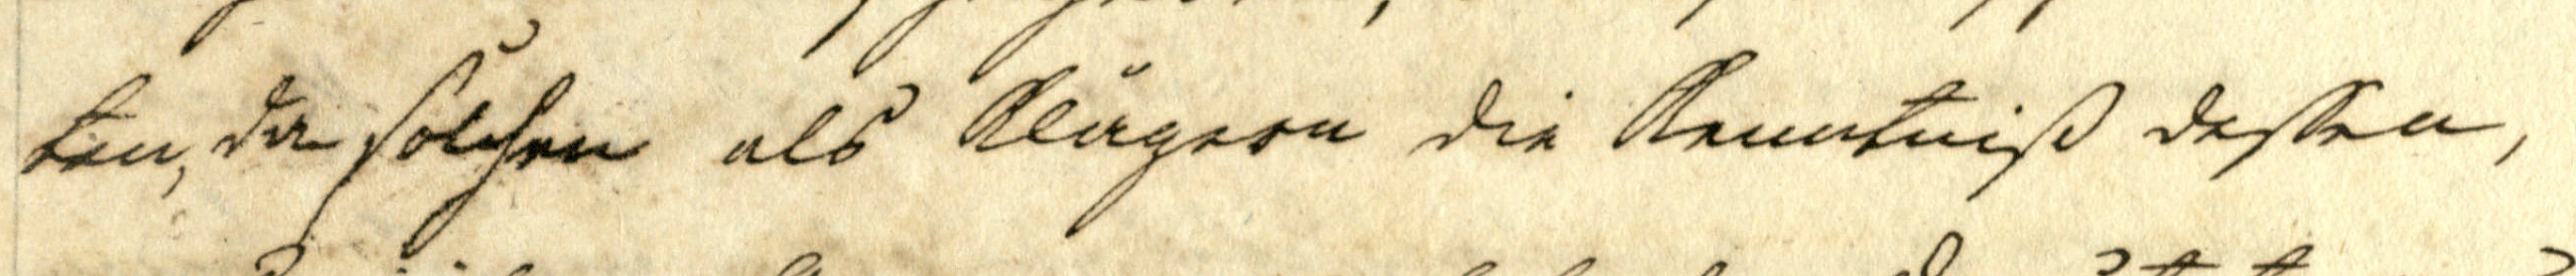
ten, da solchen als Klägern die Kenntniß dessen,
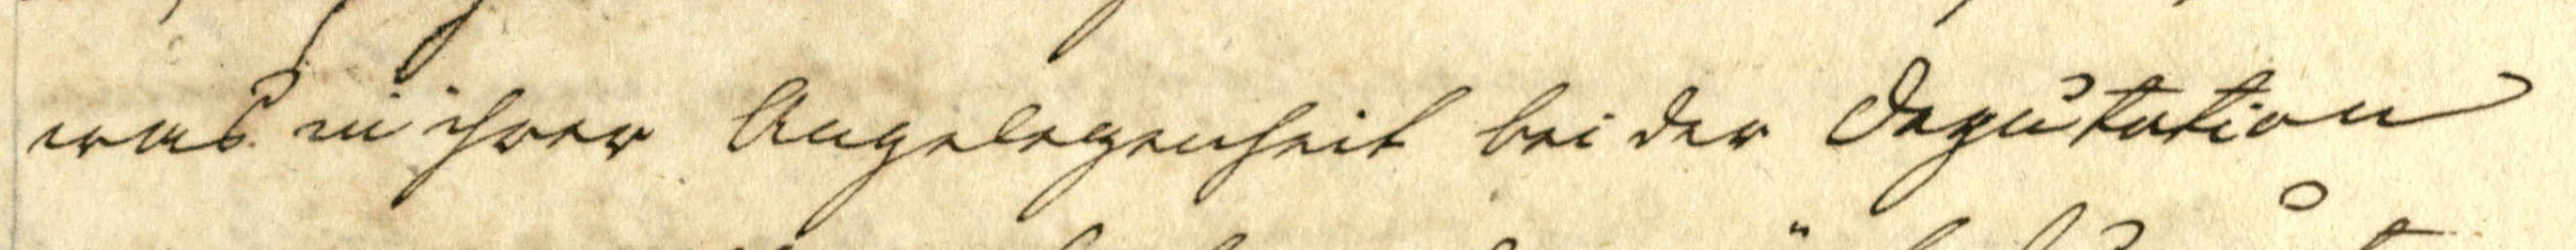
was in ihrer Angelegenheit bei der Deputation
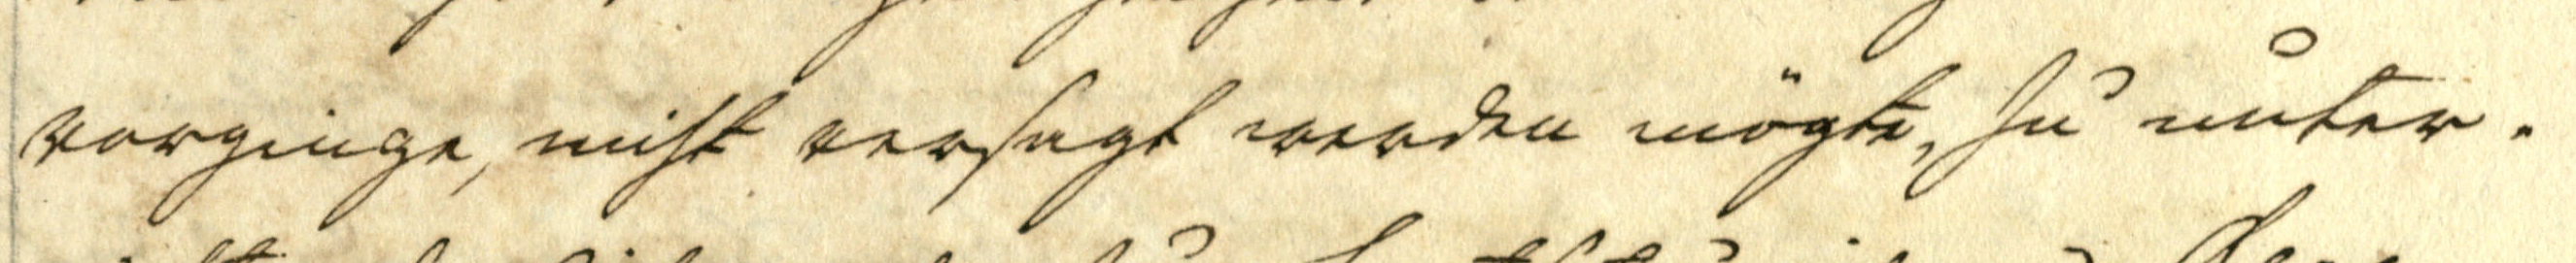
vorginge, nicht versagt werden mögte, zu unter¬
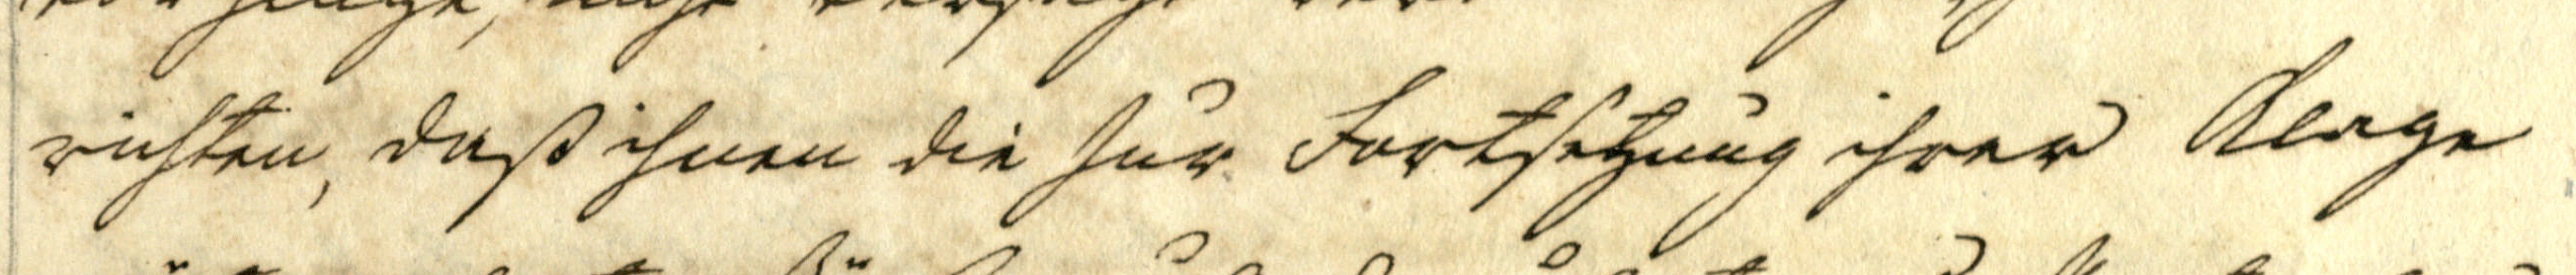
richten, daß ihnen die zur Fortsetzung ihrer Klage
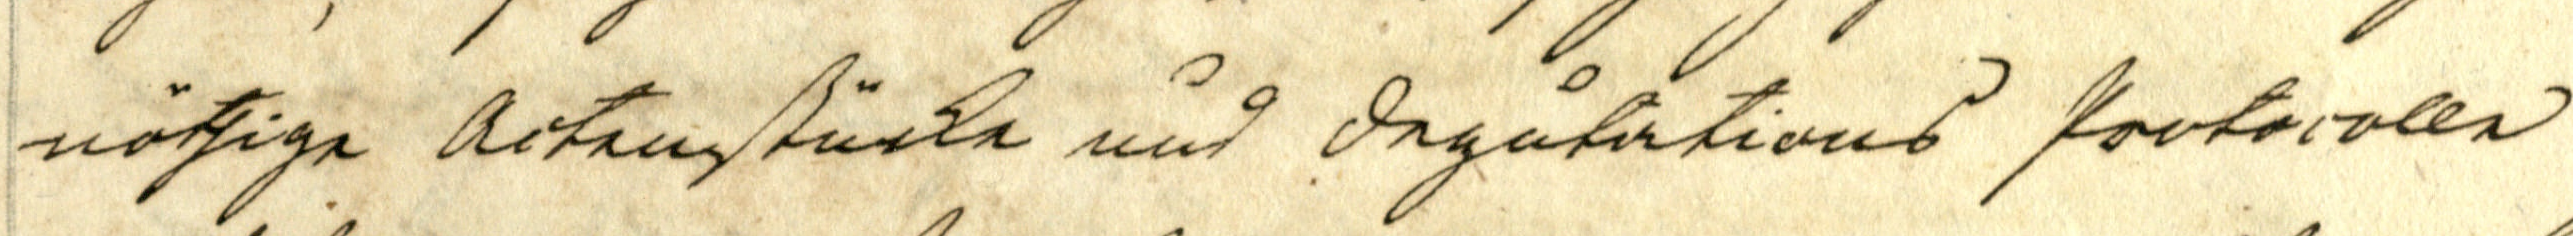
nöthige Actenstücke und Deputations Protocolle
